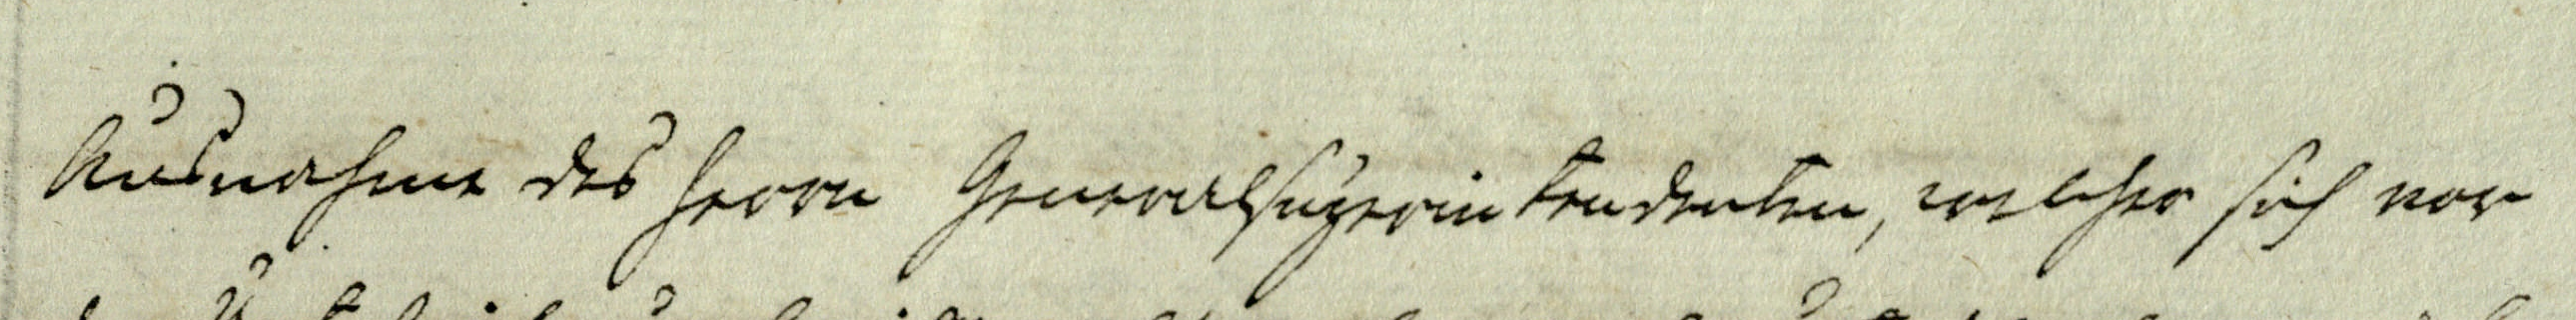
Ausnahme des Herrn Generalsuperintendenten, welcher sich vor
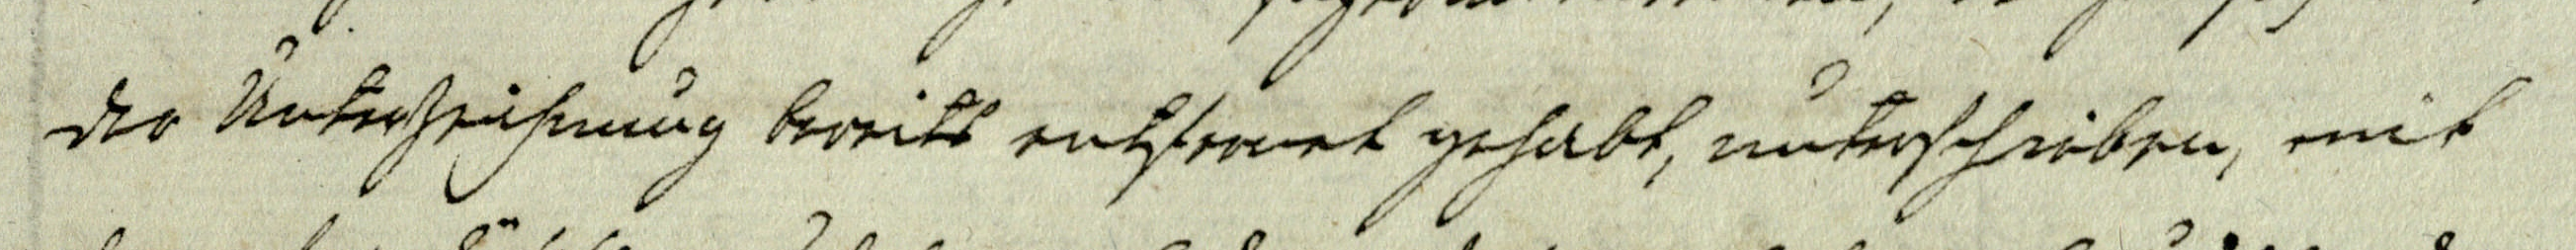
der Unterzeichnung bereits entfernet gehabt, unterschrieben, mit
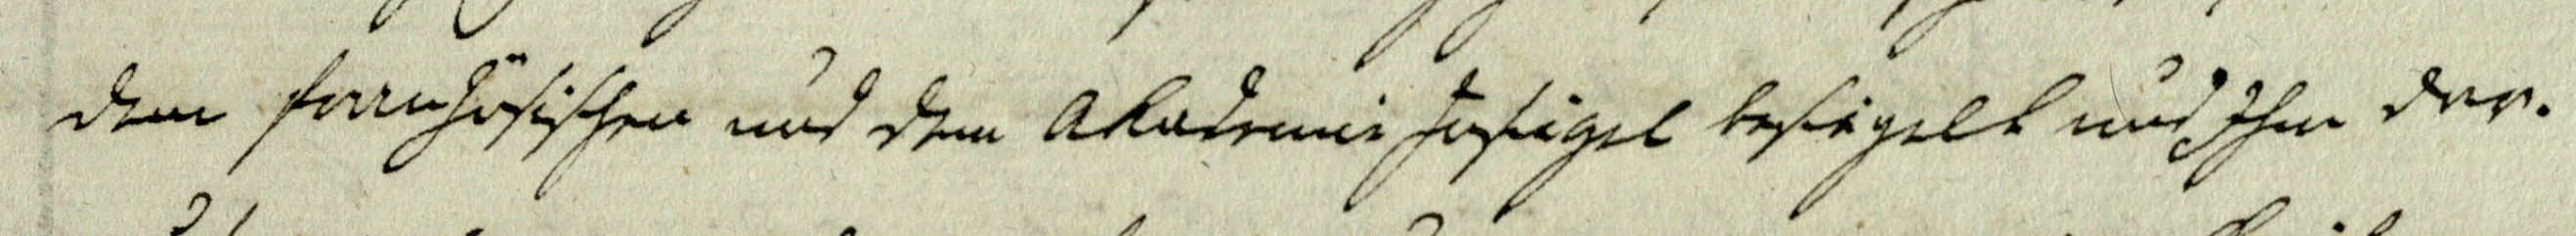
dem französischen und dem Akademie Insiegel besiegelt und Ihm dar¬
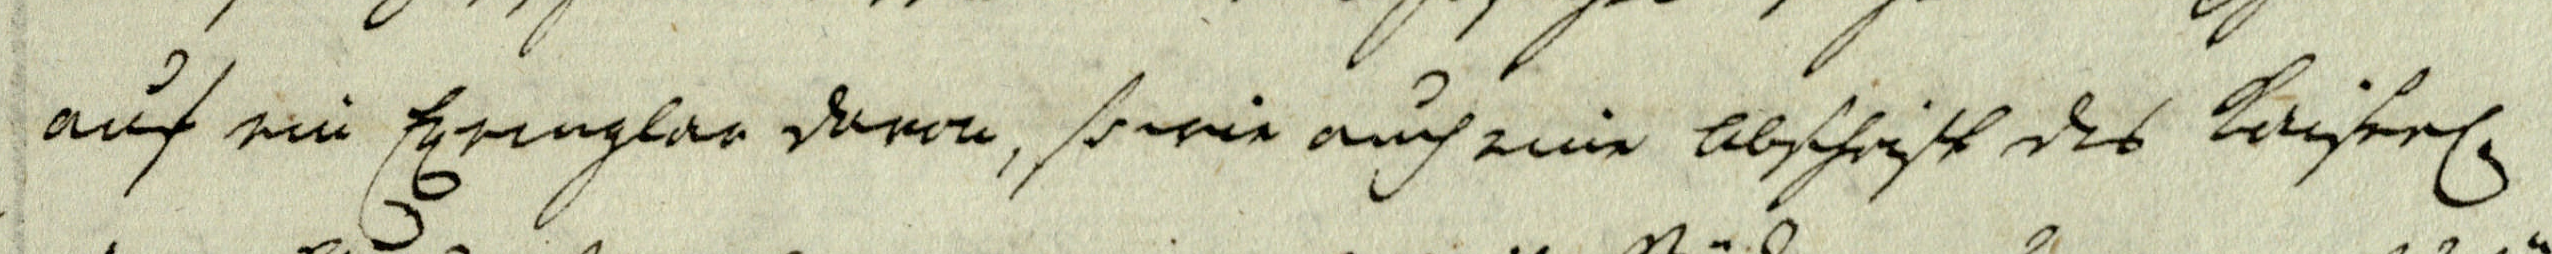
auf ein Exemplar davon, so wie auch eine Abschrift des Kaiserl.
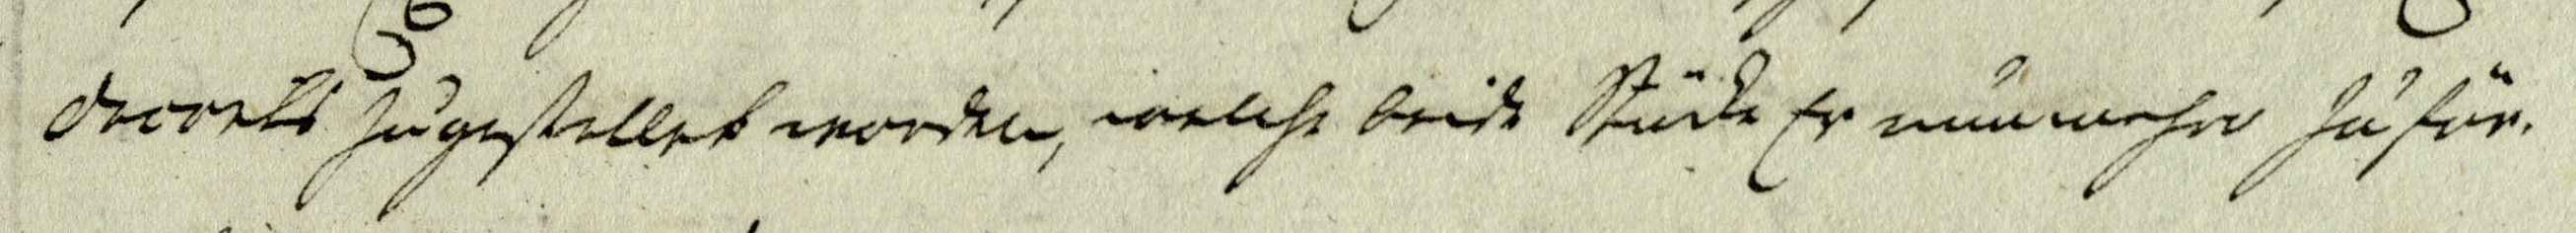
Decrets zugestellet worden, welche beide Stücke Er nunmehro zuför¬
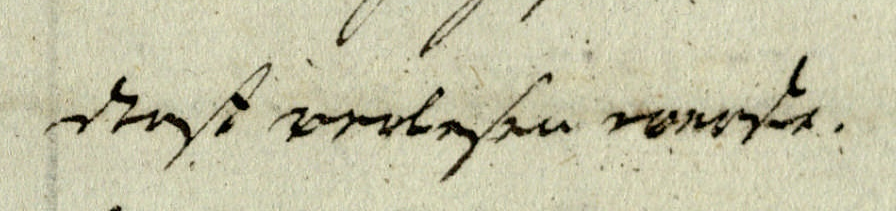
derst verlesen werde.
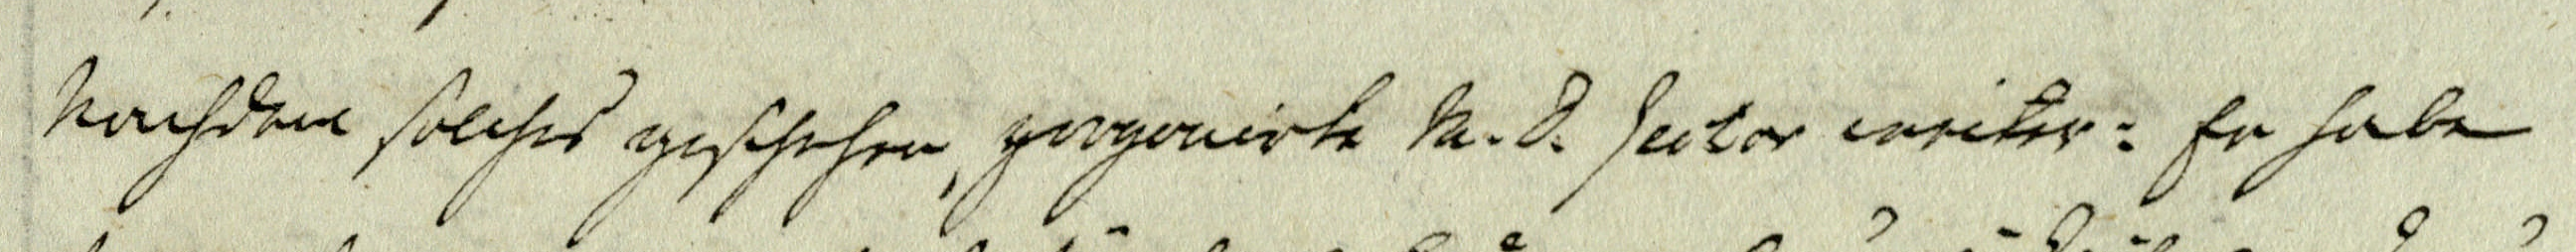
Nachdem solches geschehen, proponirte M. D. Rector weiter: Er habe
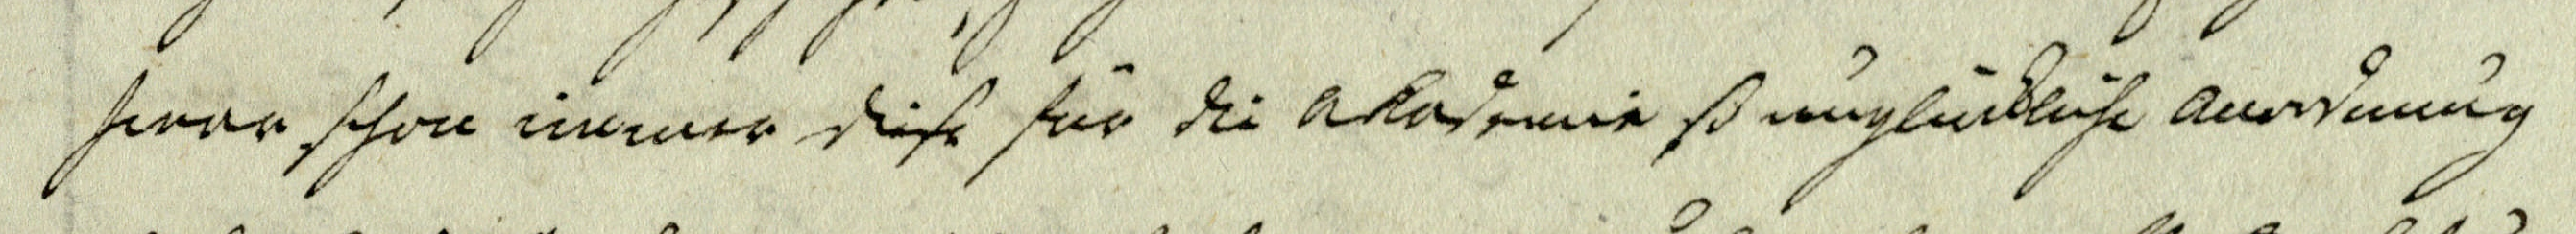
zwar schon immer diese für die Akademie so glückliche Anordnung
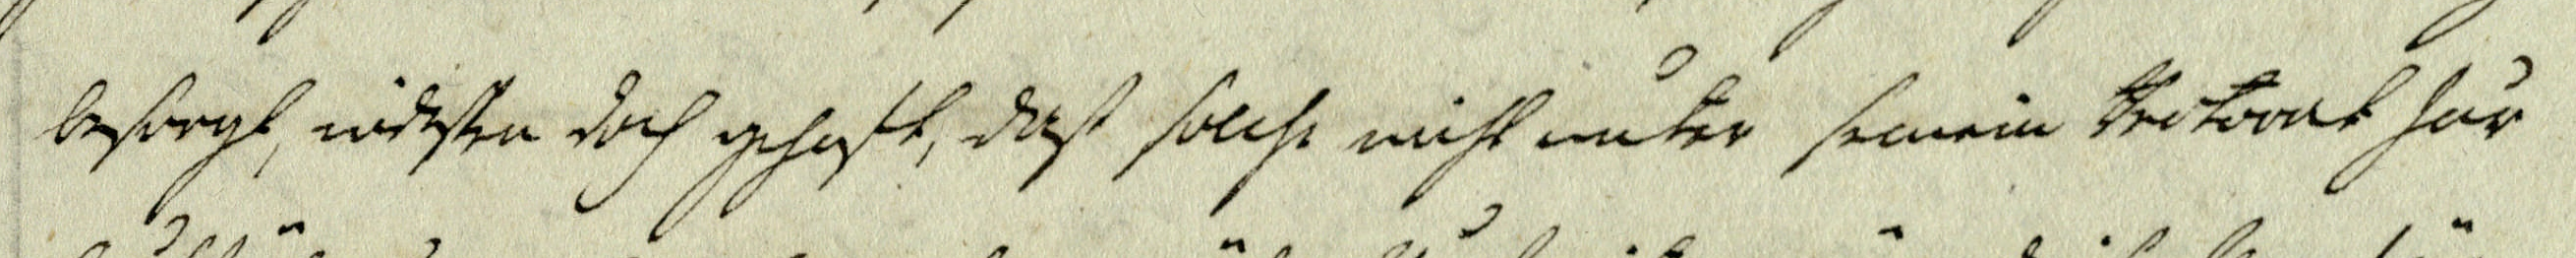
besorgt, indessen doch gehoft, daß solche nicht unter seinem Rectorat zur
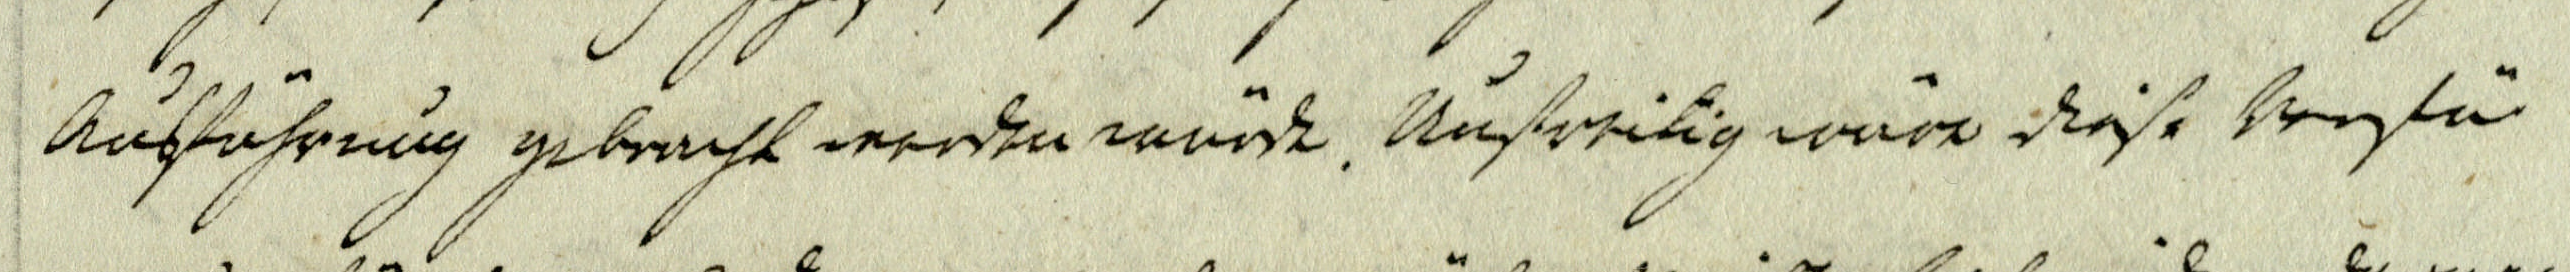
Ausführung gebracht werden würde. Unstreitig wäre diese Verfü¬
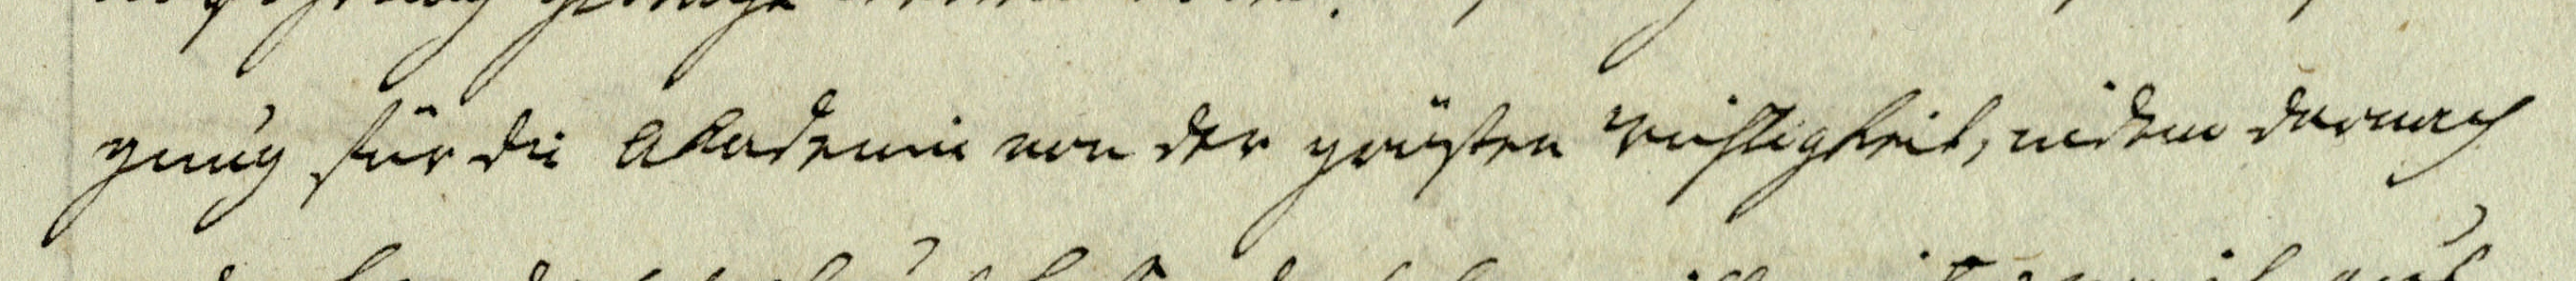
gung für die Akademie von der grösten Wichtigkeit, indem darnach
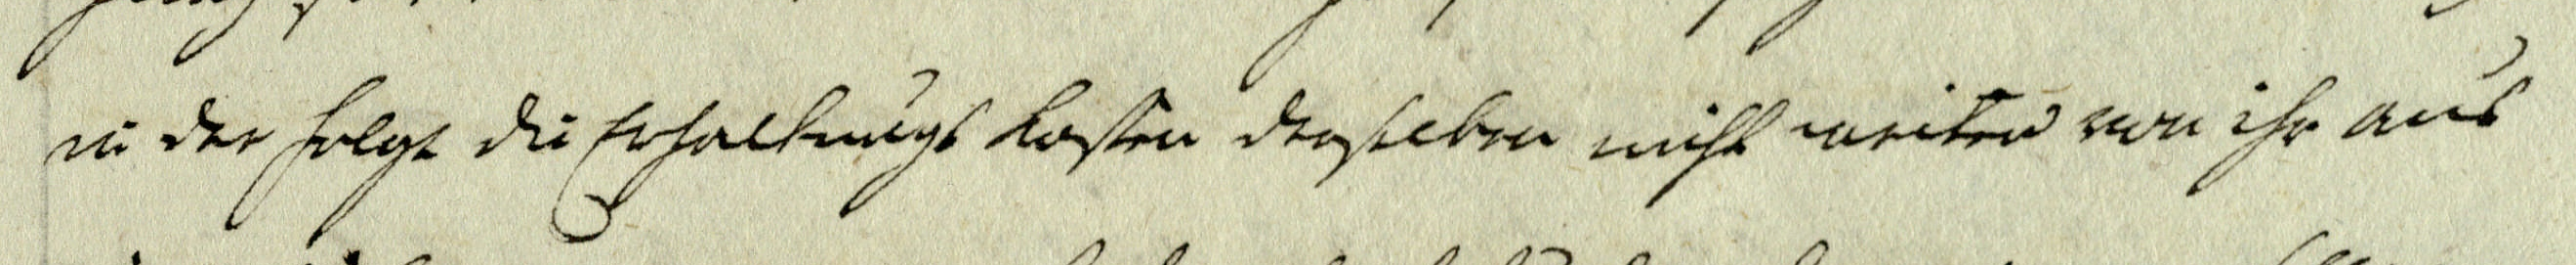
in der Folge die Erhaltungskosten derselben nicht weiter von ihr aus
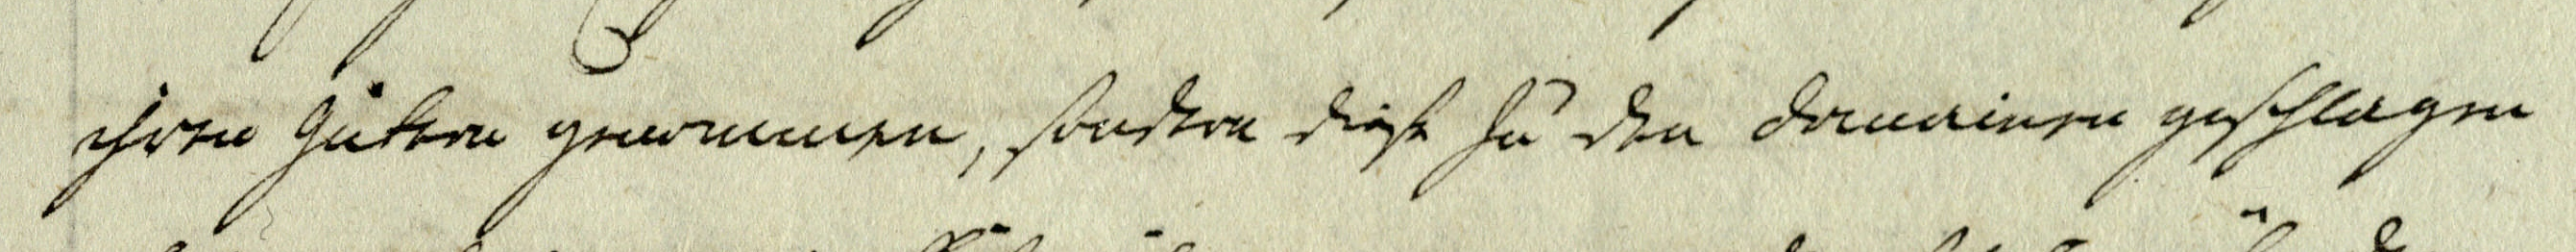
ihren Gütern genommen, sondern diese zu den Domainen geschlagen
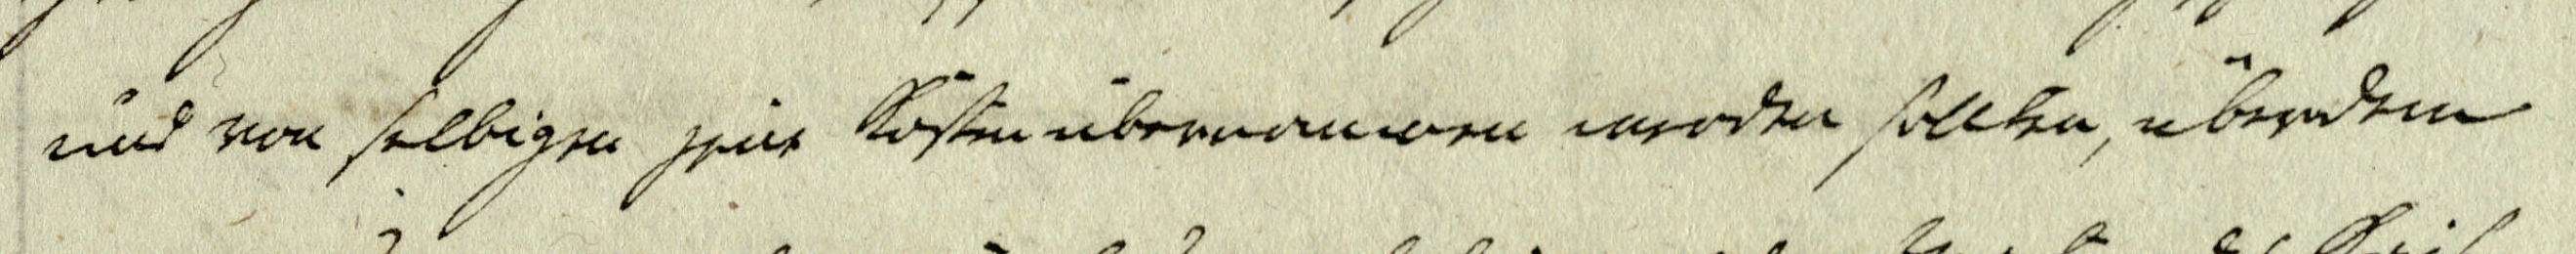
und von selbigen jene Kosten übernommen werden sollten, überdem
